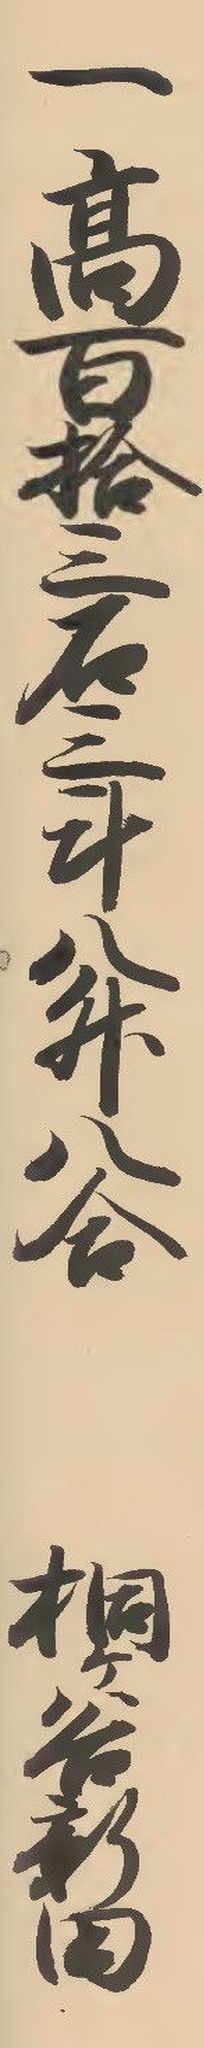一高百拾三石三斗八升八合桐ヶ谷新田
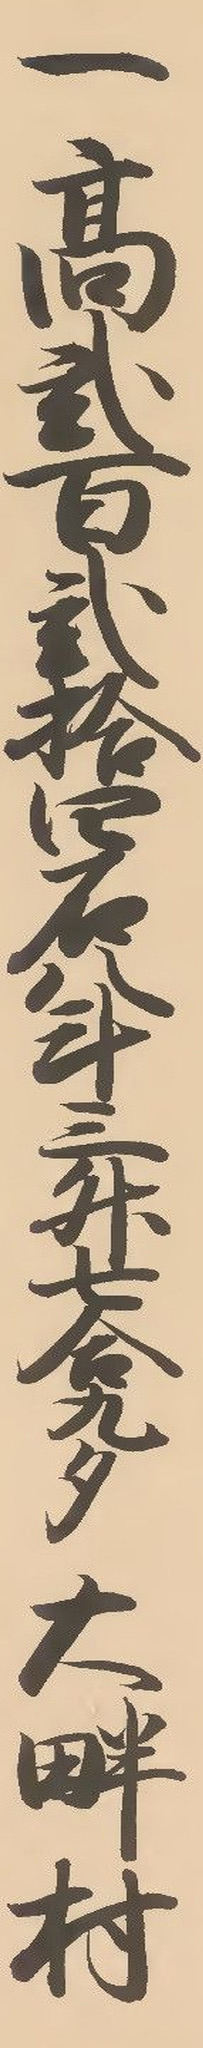一高弐百弐拾四石八斗三升七合九勺大畔村
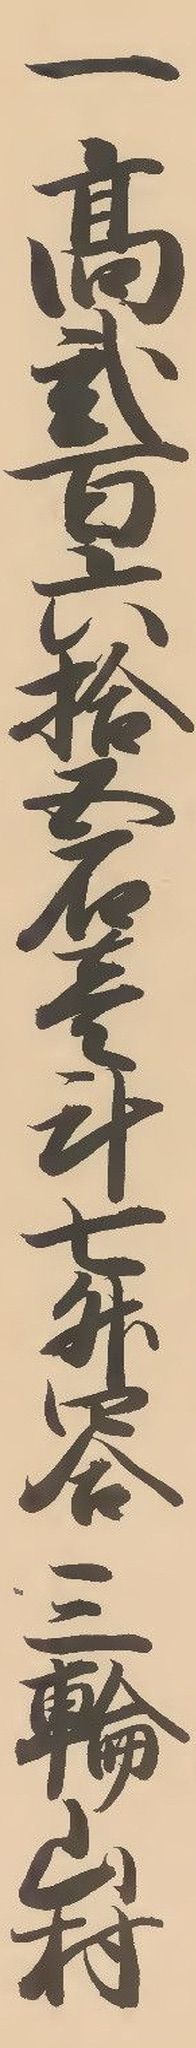一高弐百六拾五石壱斗七升四合三輪山村

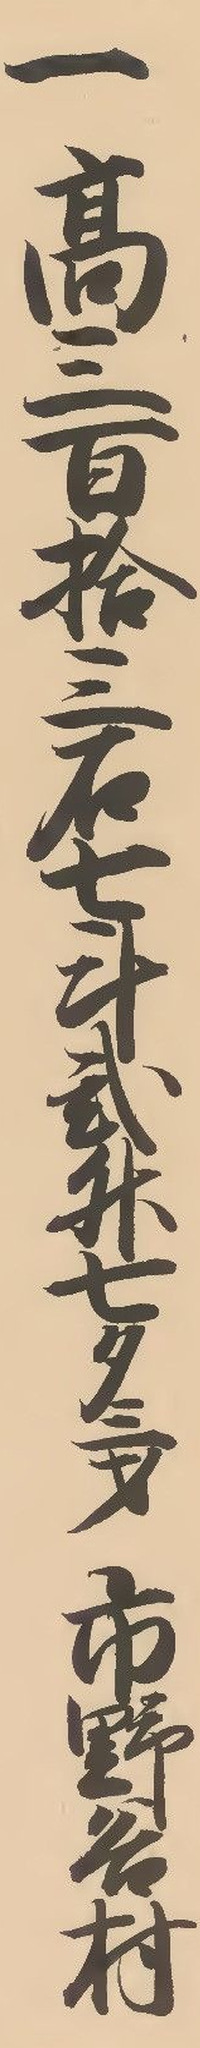一高三百拾三石七斗弐升七勺三才市野谷村
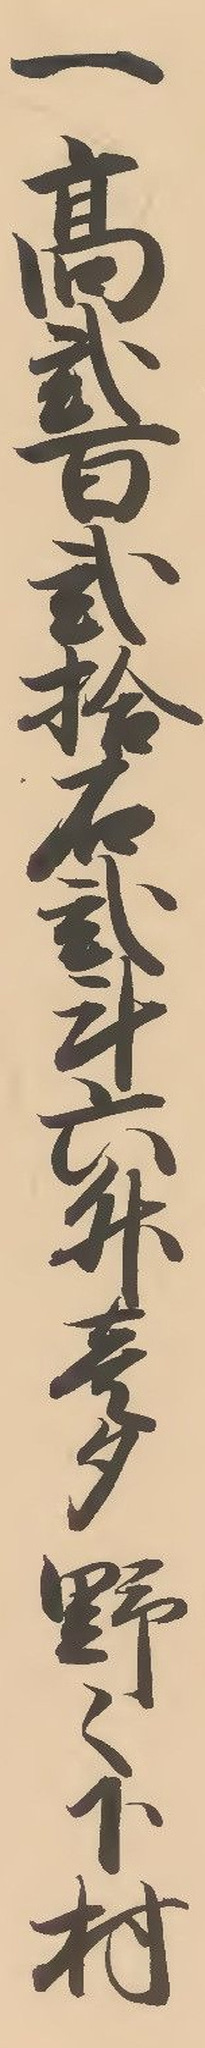一高弐百弐拾石弐斗六升壱勺野々下村
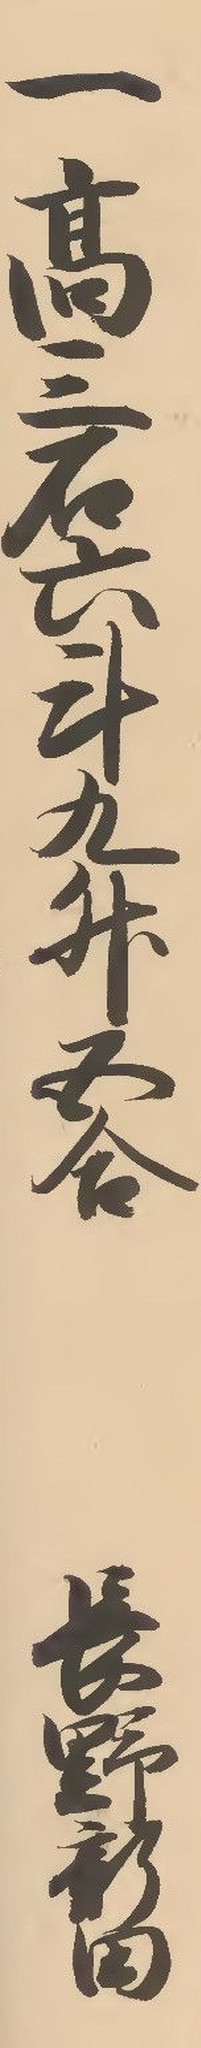一高三石六斗九升五合長野新田
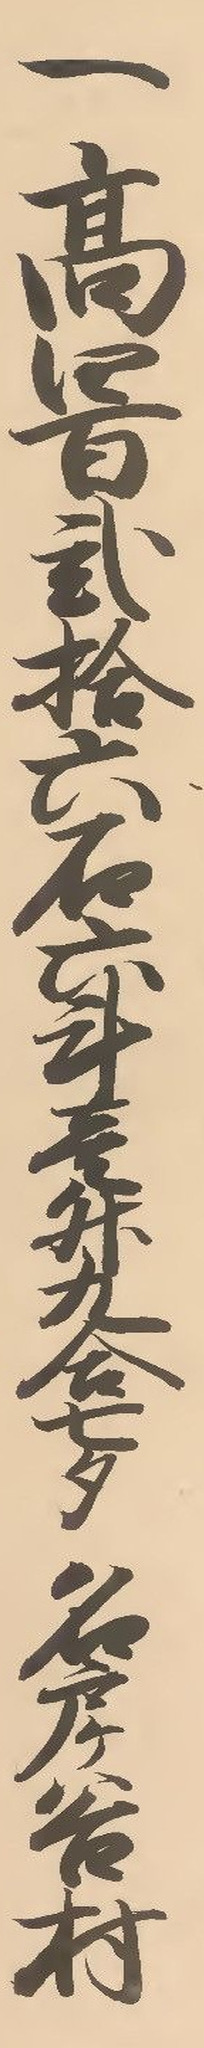一高四百弐拾六石六斗壱升九合七勺名戸ヶ谷村
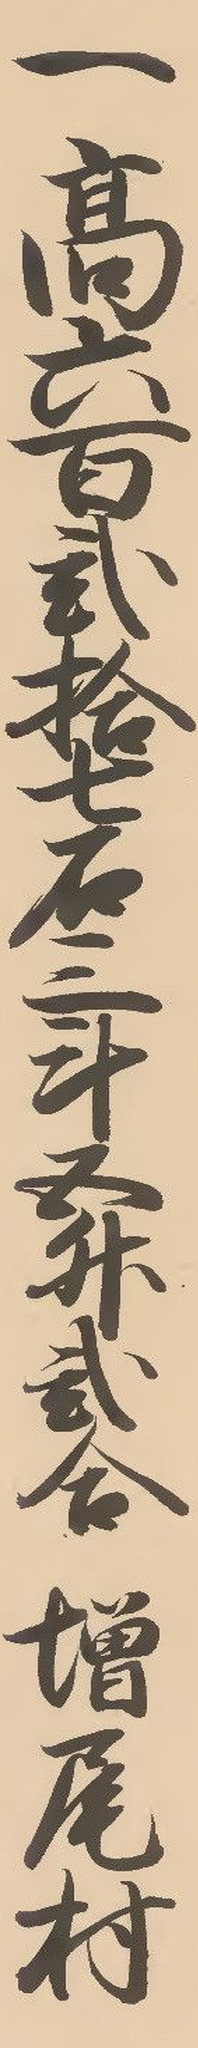一高六百弐拾七石三斗五升弐合増尾村
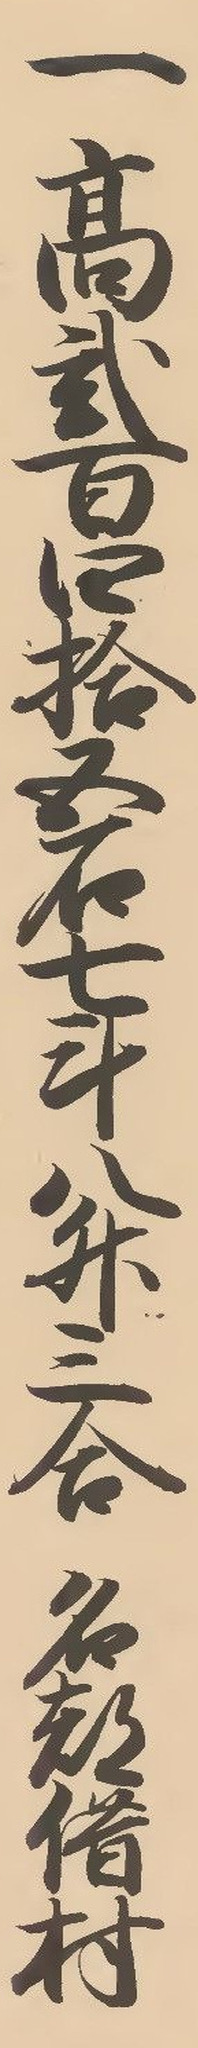一高弐百四拾五石七斗八升三合名都借村
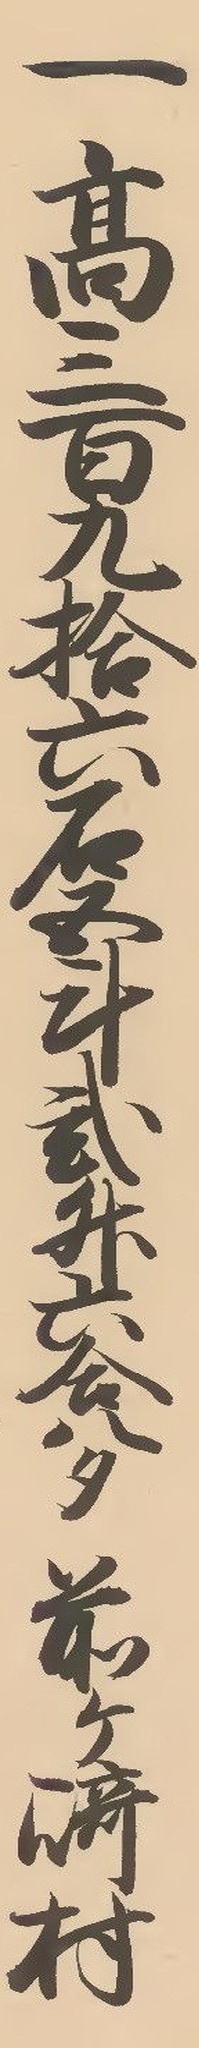一高三百九拾六石五斗弐升六合八勺前ヶ崎村

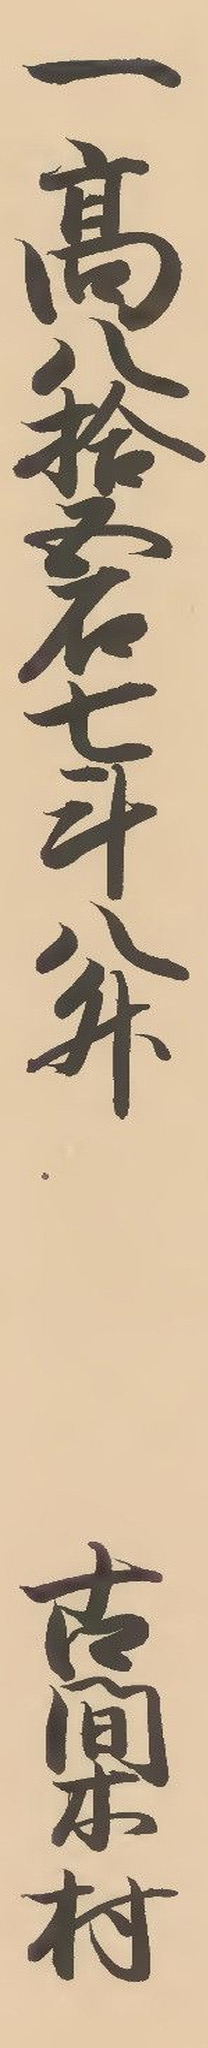一高八拾五石七斗八升古間木村
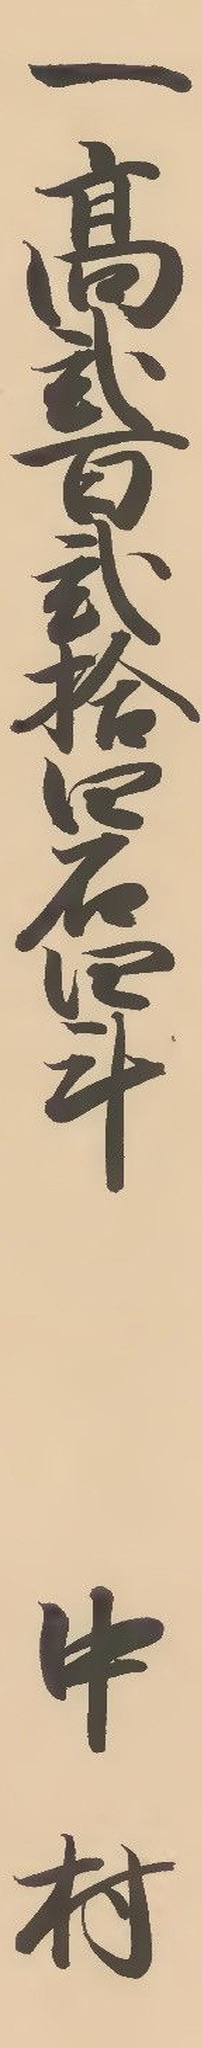一高弐百弐拾四石四斗中村
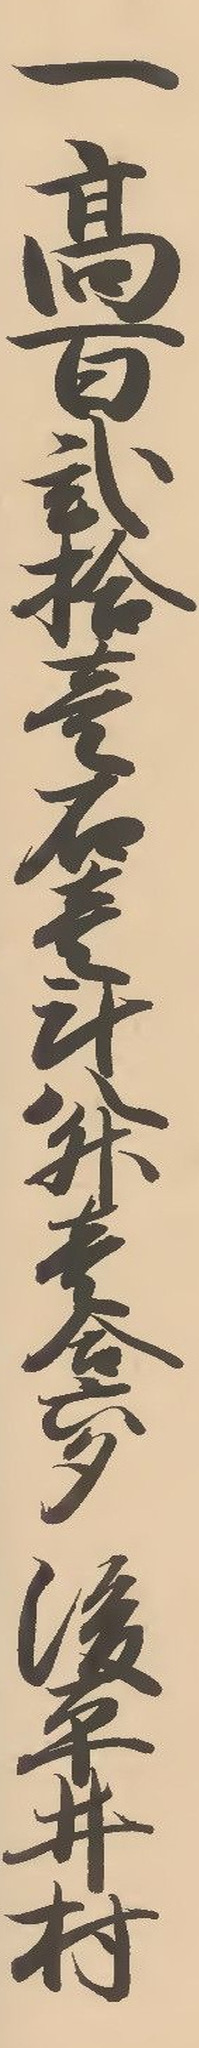一高百弐拾壱石壱斗八升壱合六勺後平井村
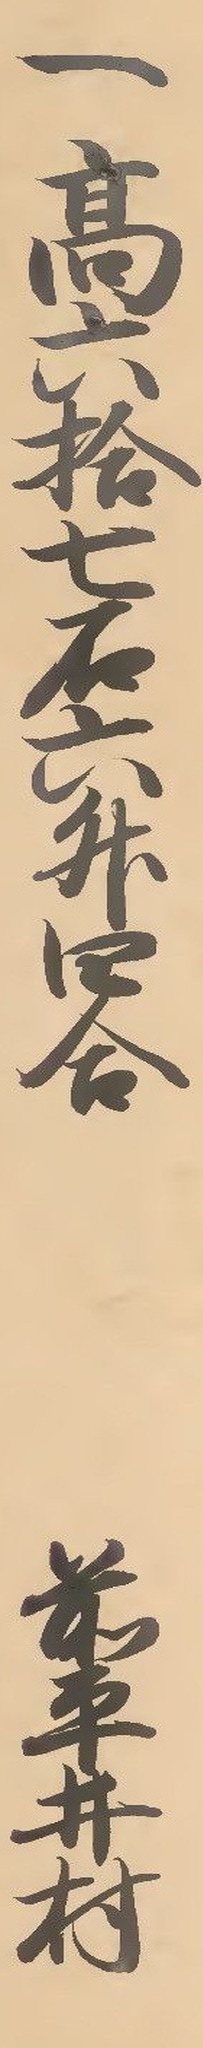一高六拾七石六升四合前平井村
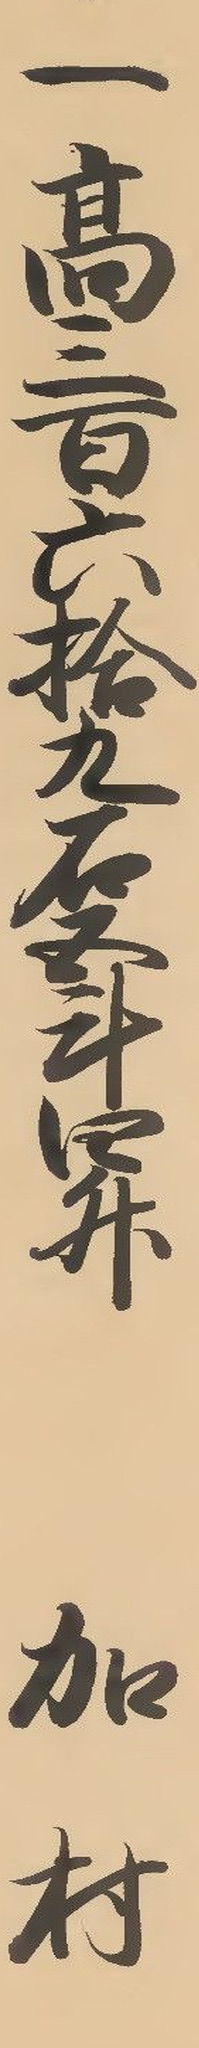一高三百六拾九石五斗四升加村
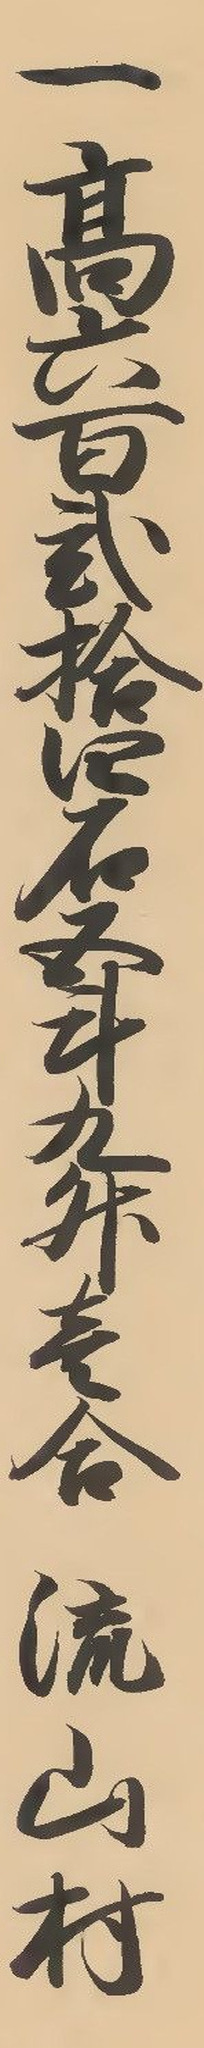一高六百弐拾四石五斗九升壱合流山村
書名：下総国郷帳
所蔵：国立公文書館 National Archives of Japan
